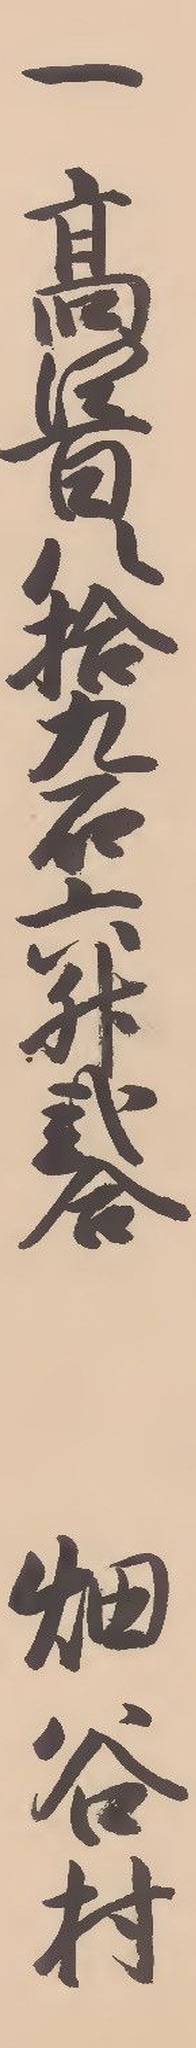一高四百八拾九石六升弐合畑谷村
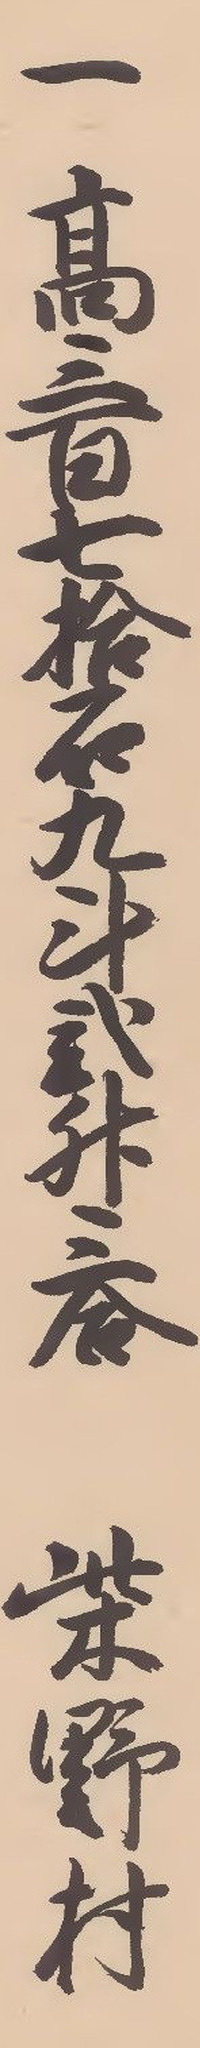一高三百七拾石九斗弐升三合柴野村
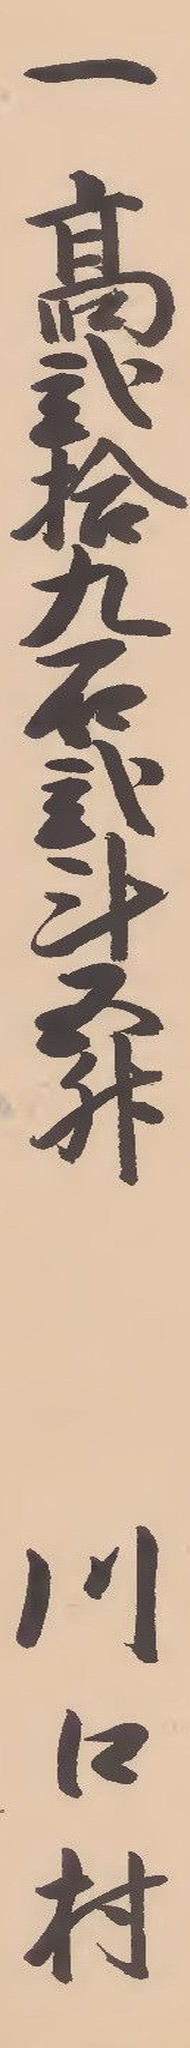一高弐拾九石弐斗五升川口村
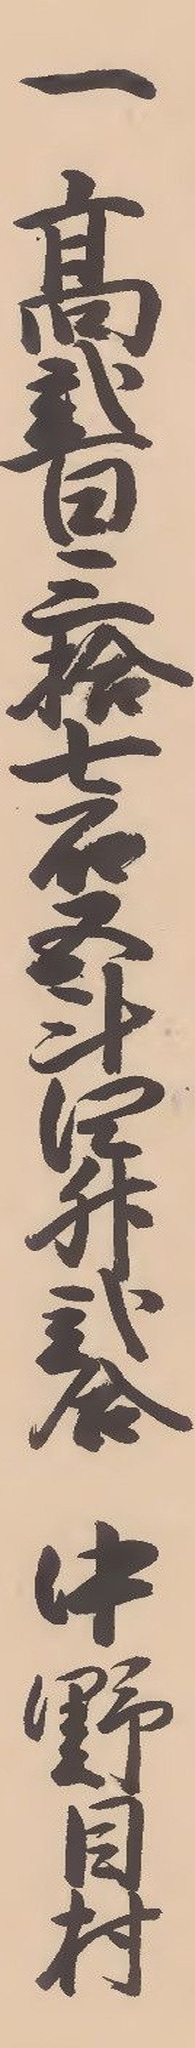一高弐百三拾七石五斗四升弐合中野目村
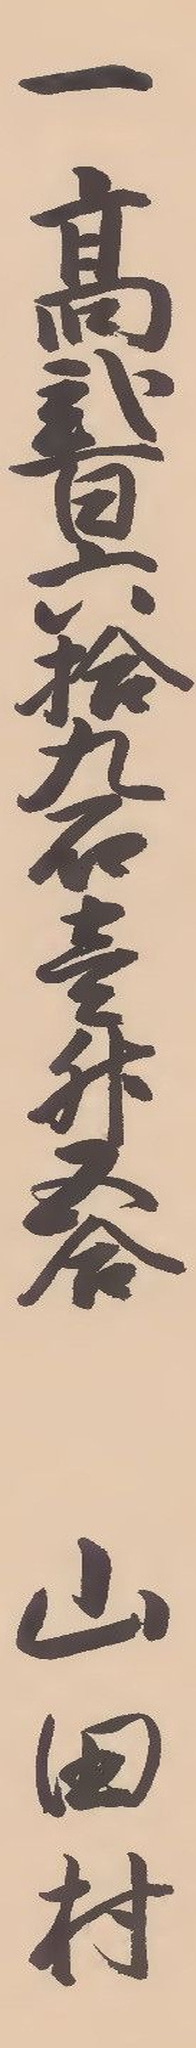一高弐百六拾九石壱升五合山田村
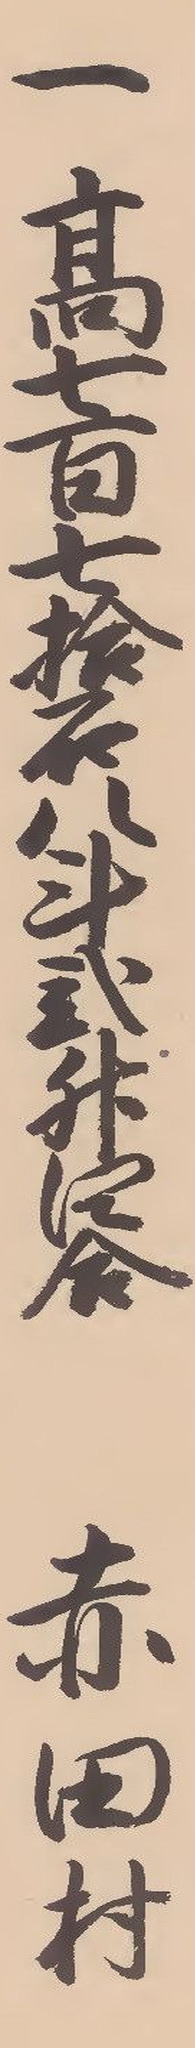一高七百七拾石八斗弐升四合赤田村
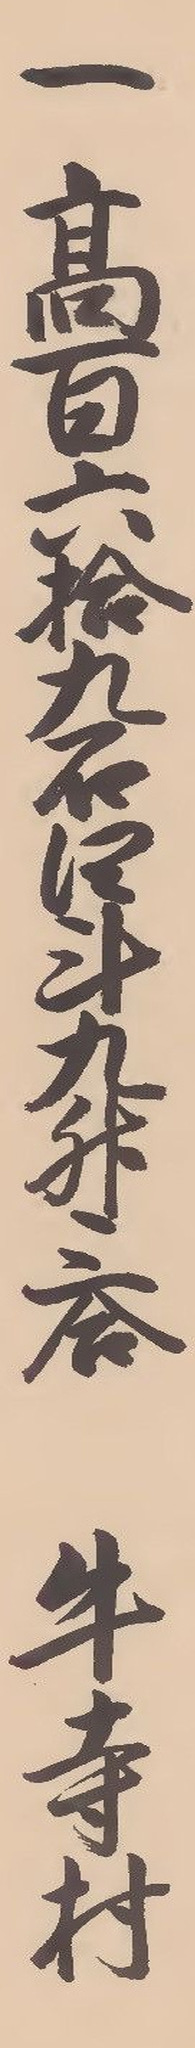一高百六拾九石四斗九升三合牛寺村

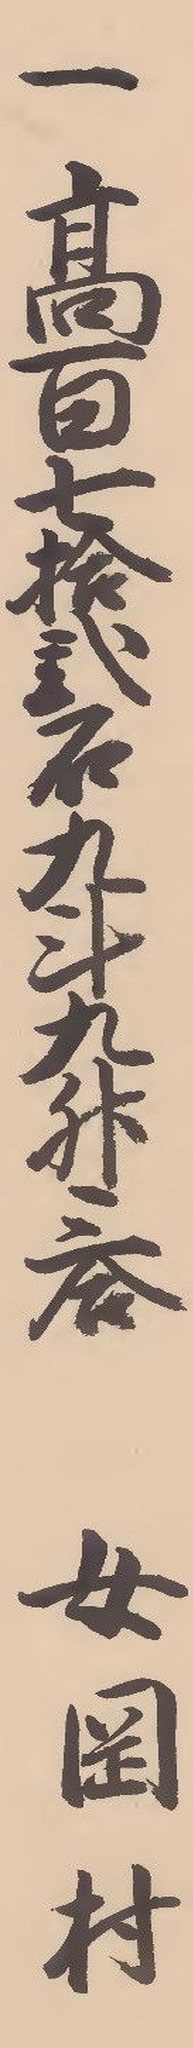一高百七拾弐石九斗九升三合女岡村
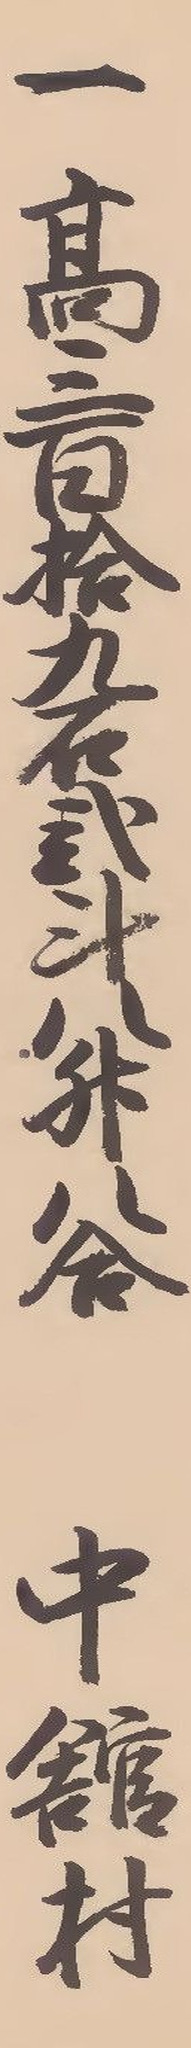一高三百拾九石弐斗八升八合中館村
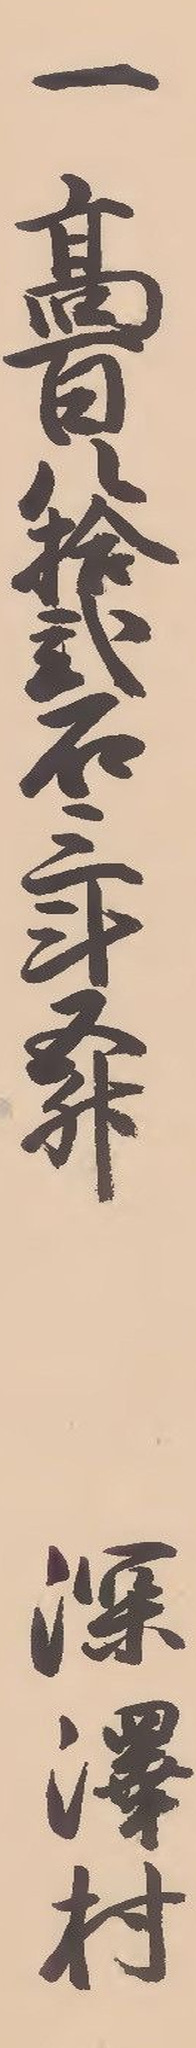一高百八拾弐石三斗五升深沢村
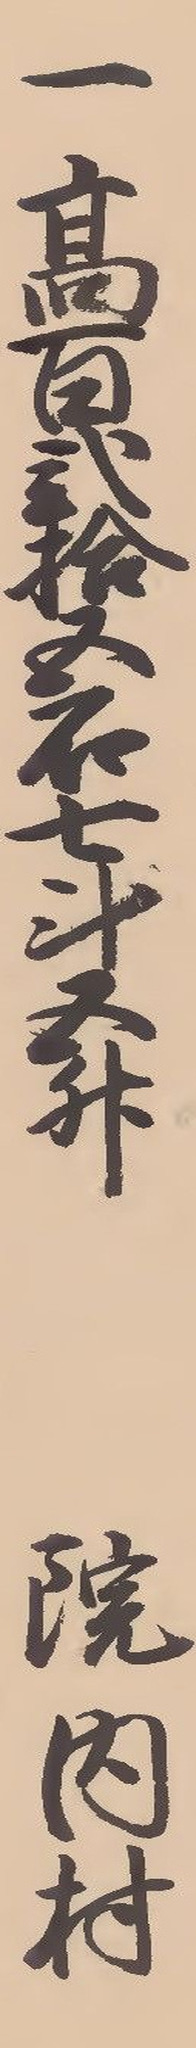一高百弐拾五石七斗五升院内村
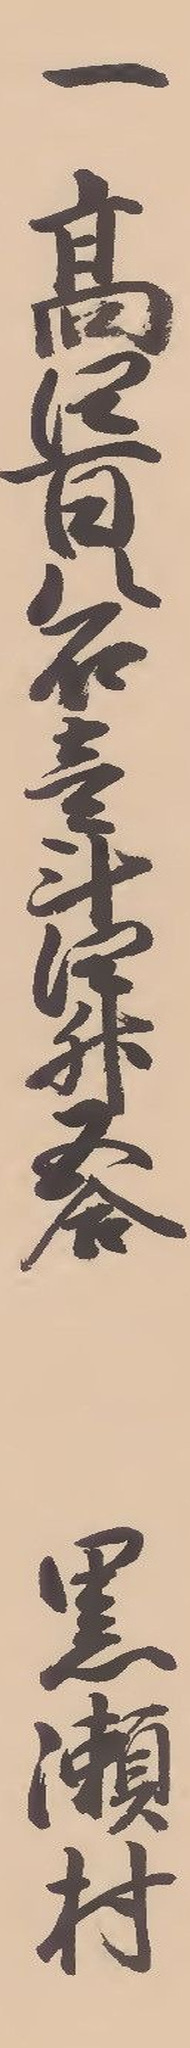一高四百八石壱斗四升五合黒瀬村
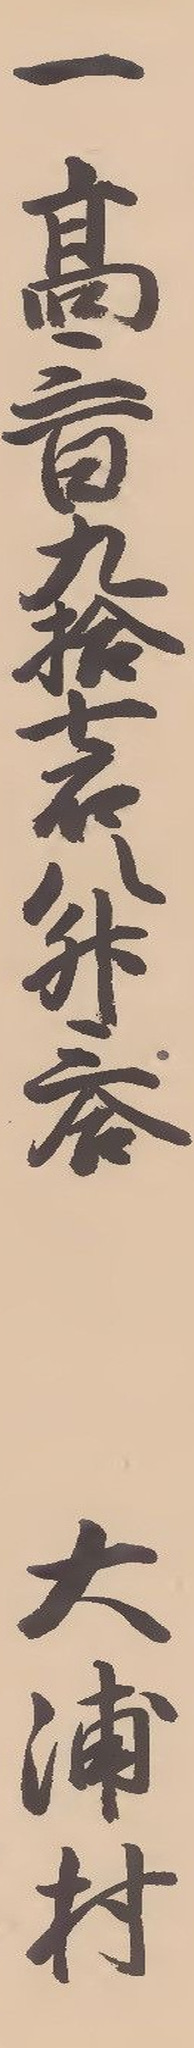一高三百九拾七石八升三合大浦村
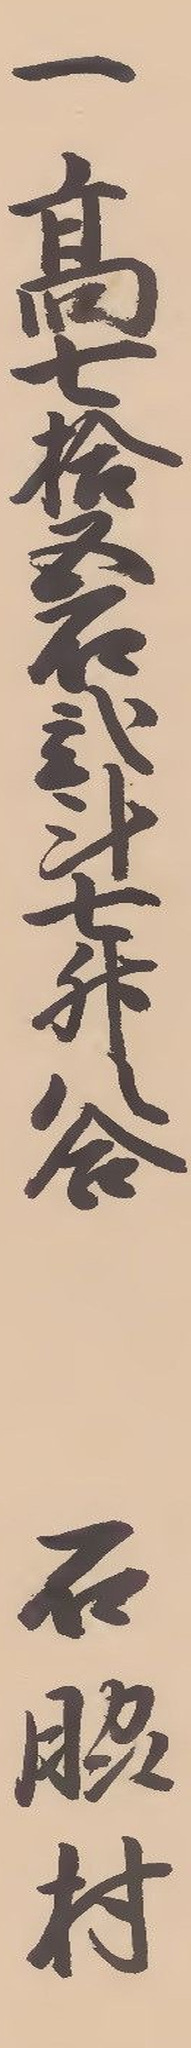一高七拾五石弐斗七升八合石脇村

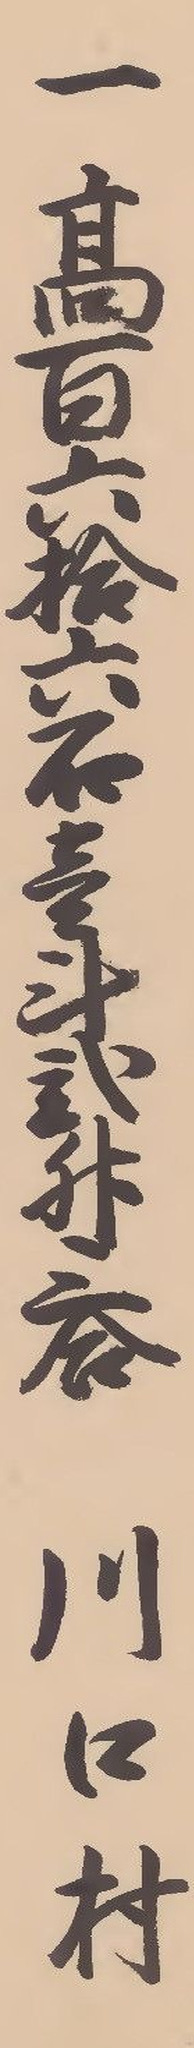一高百六拾六石壱斗弐升三合川口村
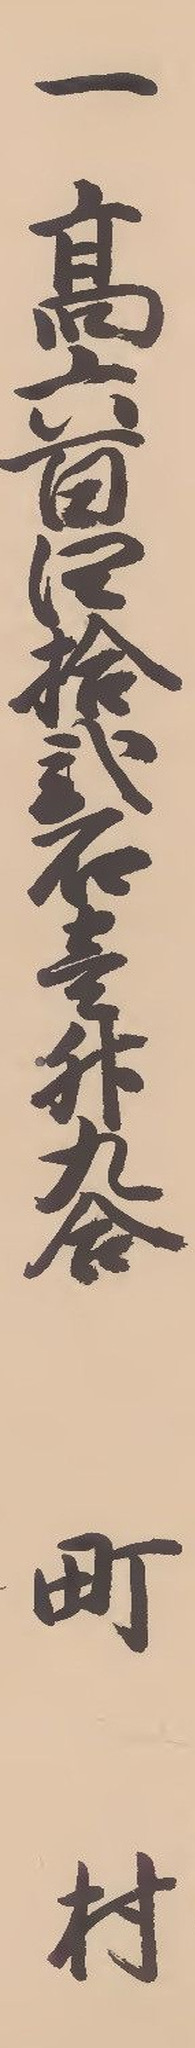一高六百四拾弐石壱升九合町村
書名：出羽国郷帳　５
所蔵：国立公文書館 National Archives of Japan
